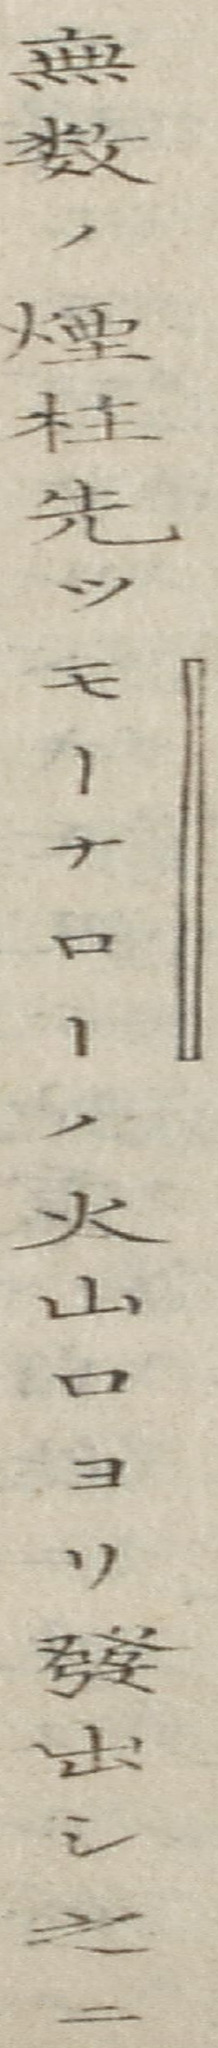無数ノ煙柱先ツモーナローノ火山口ヨリ発出シ之ニ
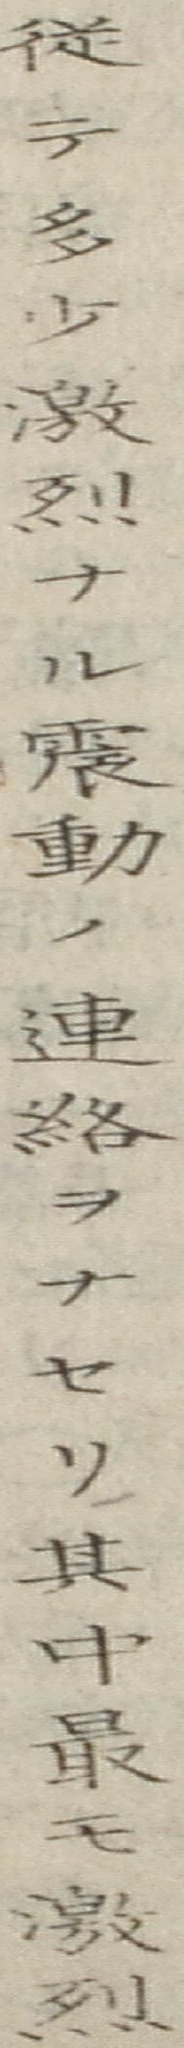従テ多少激烈ナル震動ノ連絡ヲナセリ其中最モ激烈
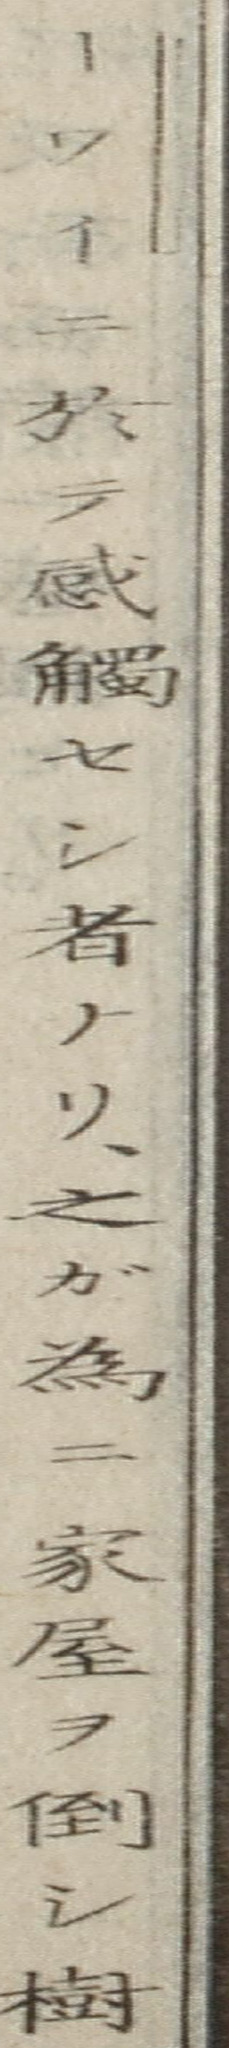ーワイニ於テ感触セシ者ナリ、之ガ為ニ家屋ヲ倒シ樹
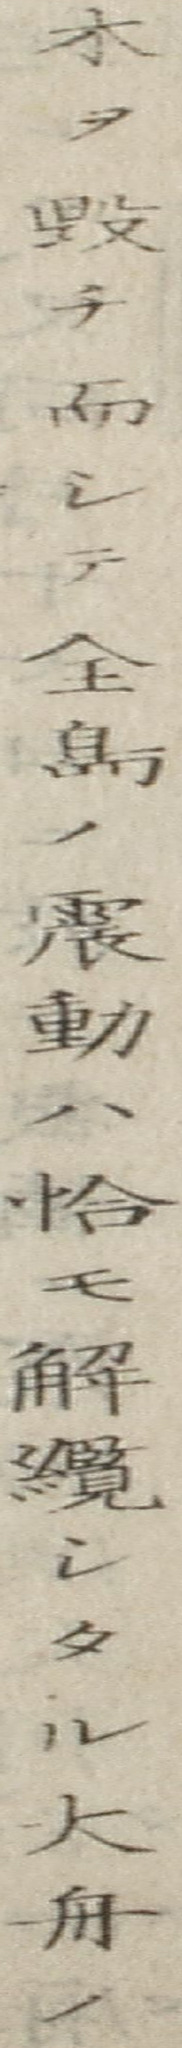木ヲ毀チ而シテ全島ノ震動ハ恰モ解纜シタル大舟ノ
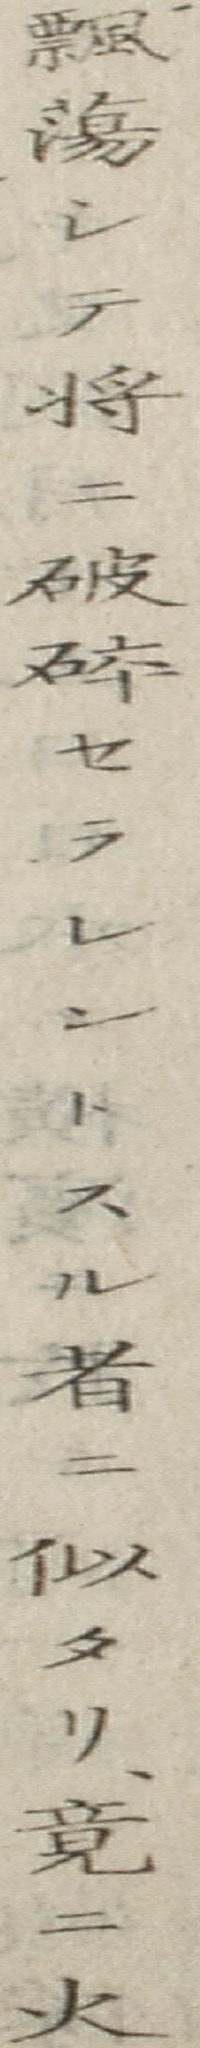飄蕩シテ将ニ破砕セラレントスル者ニ似タリ、竟ニ火
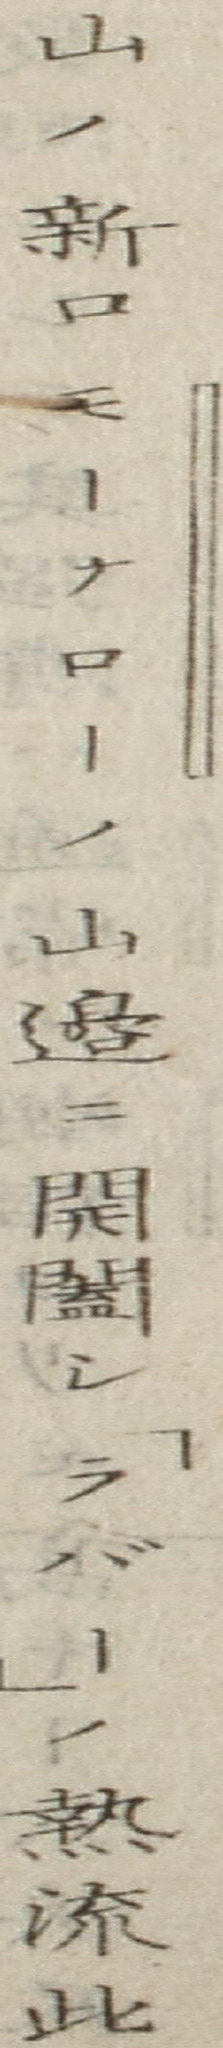山ノ新口モーナローノ山辺に開闔シ「ラバー」ノ熱流此
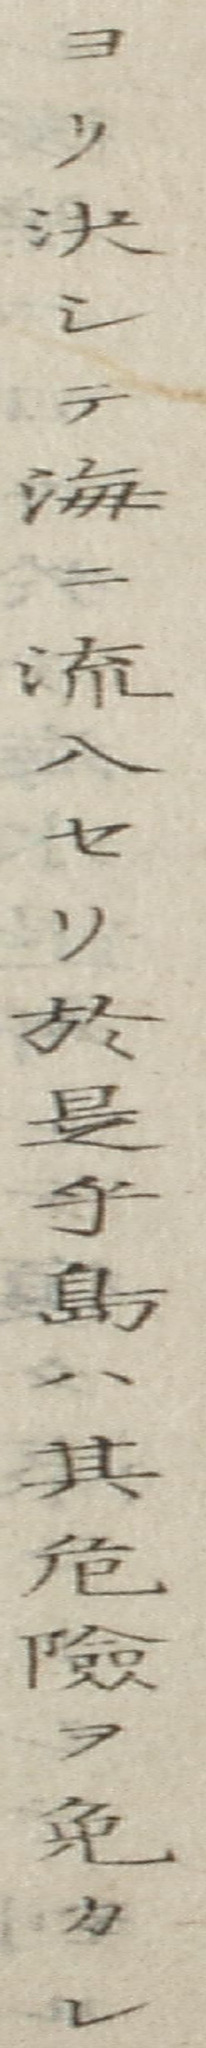ヨリ決シテ海ニ流入セリ於是乎島ハ其危険ヲ免カレ
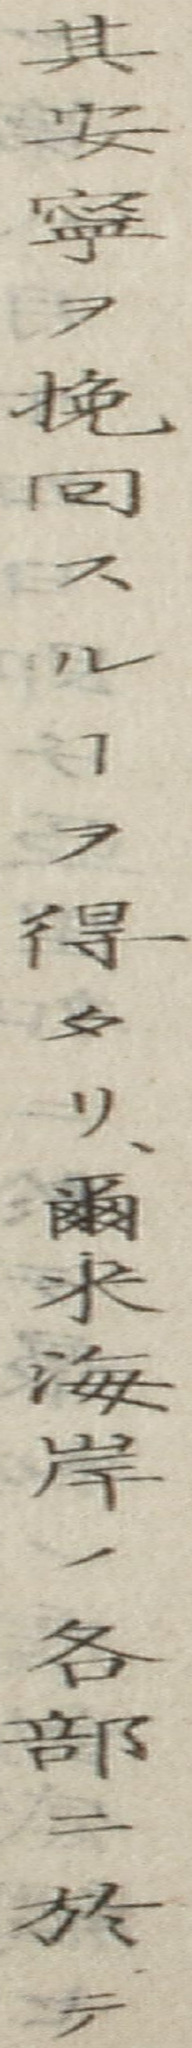其安寧ヲ挽回スルヿヲ得タリ、爾来海岸ノ各部ニ於テ
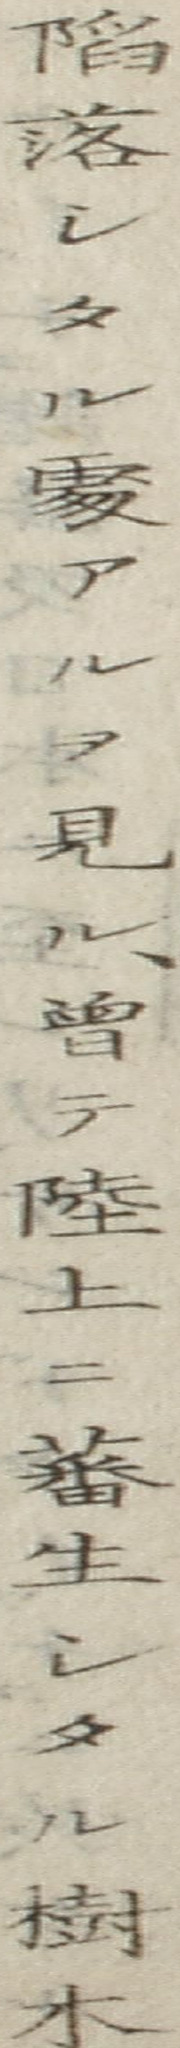陥落シタル處アルヲ見ル、曾テ陸上ニ蕃生シタル樹木
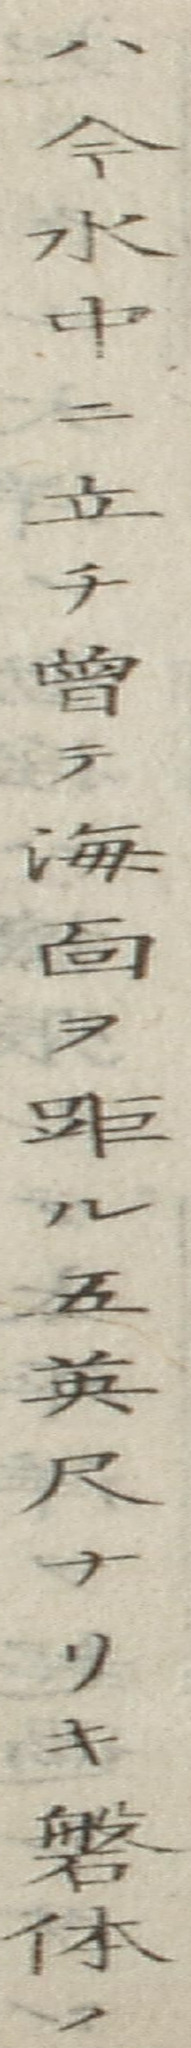ハ今水中ニ立チ曾テ海面ヲ距ル五英尺ナリキ磐体ノ
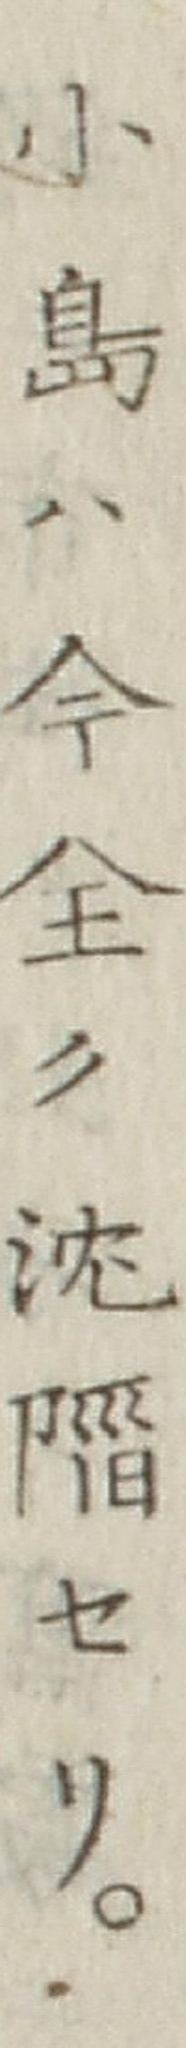小島ハ今全ク沈陥セリ。
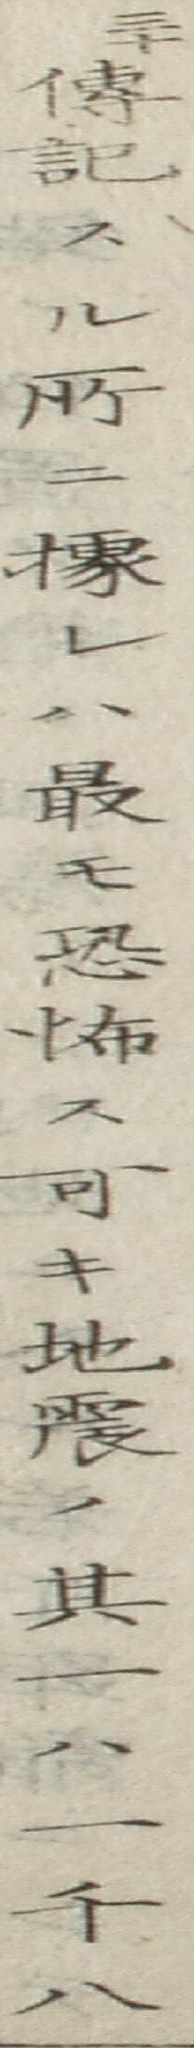三十伝記スル所ニ拠レハ最モ恐怖ス可キ地震ノ其一ハ一千八
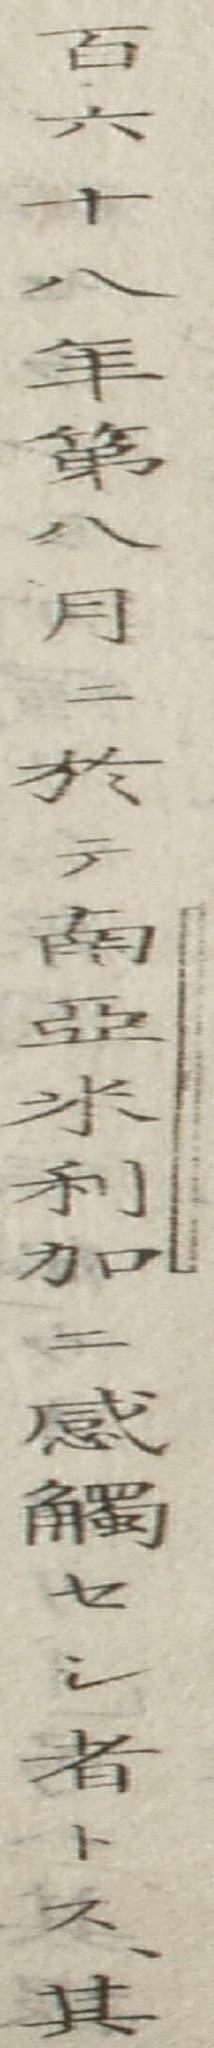百六十八年第八月ニ於テ南亜米利加ニ感触セシ者トス、其
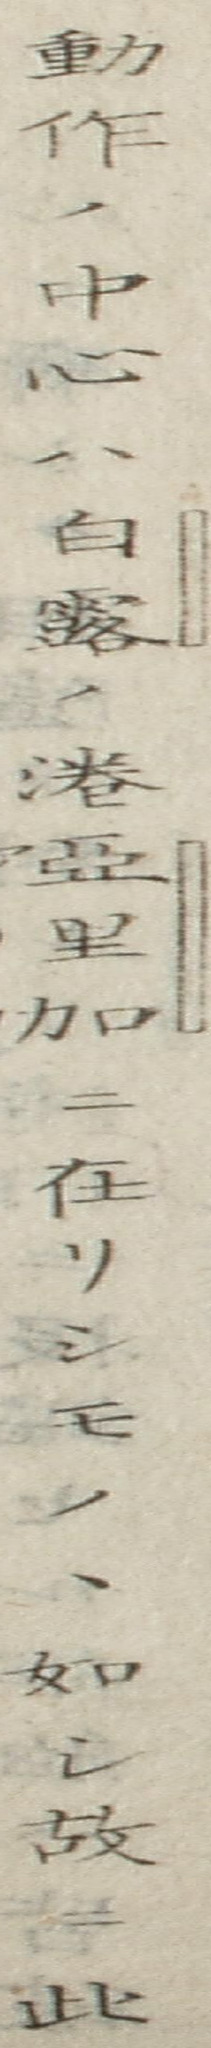動作ノ中心ハ白露ノ港亜利加ニ在リシモノ、如シ故ニ此
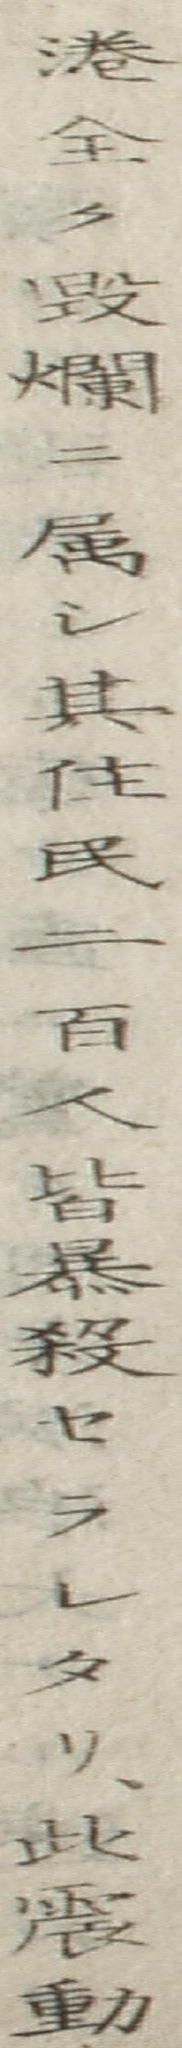港全ク毀爛ニ属シ其住民二百人皆暴殺セラレタリ、此震動
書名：地形論　巻二
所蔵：東京大学地震研究所図書室 Earthquake Research Institute Library, The University of Tokyo, JAPAN
